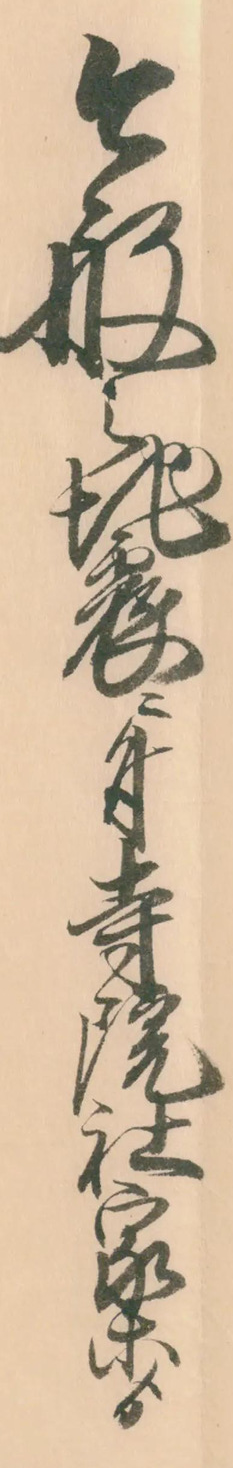今般之地震に付寺院社家等より
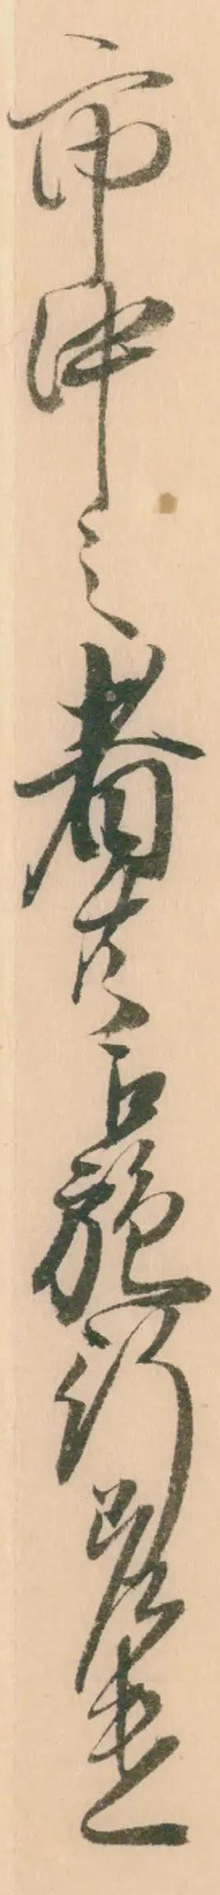市中の者共え施行差遣
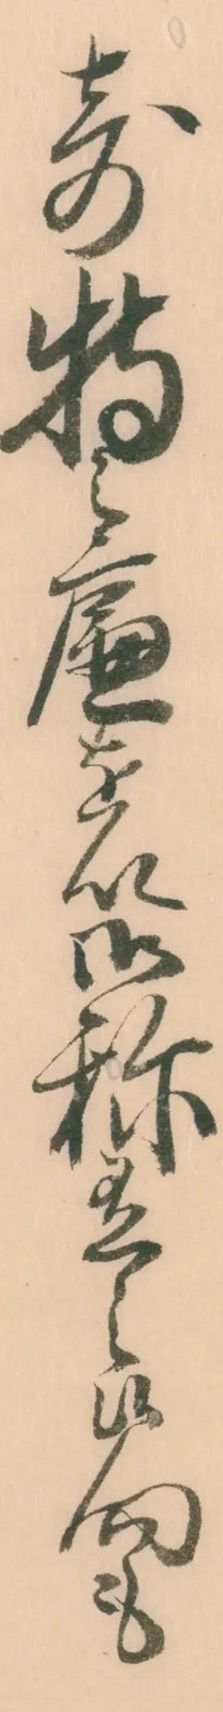奇特の廉を以御称有之候向も
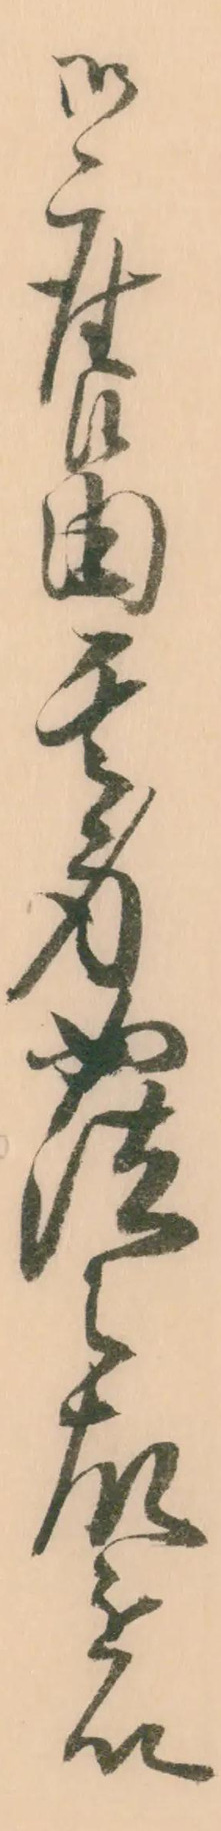御座候由其身如法之故を以
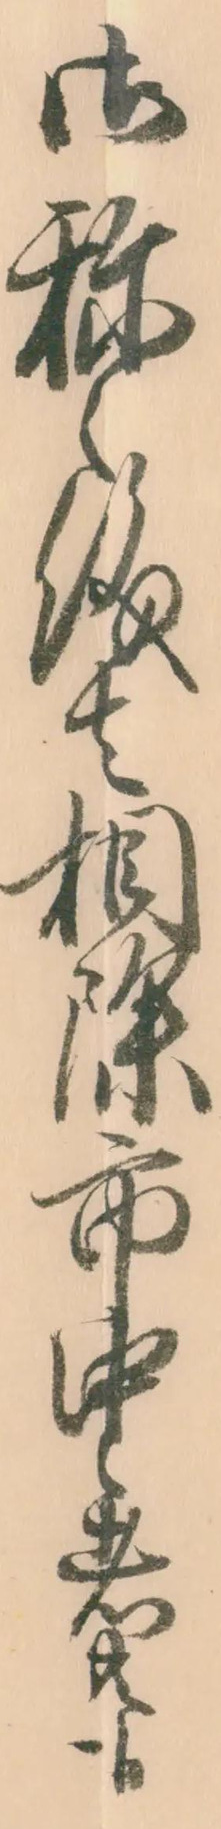御称の儀は相除市中の者共え
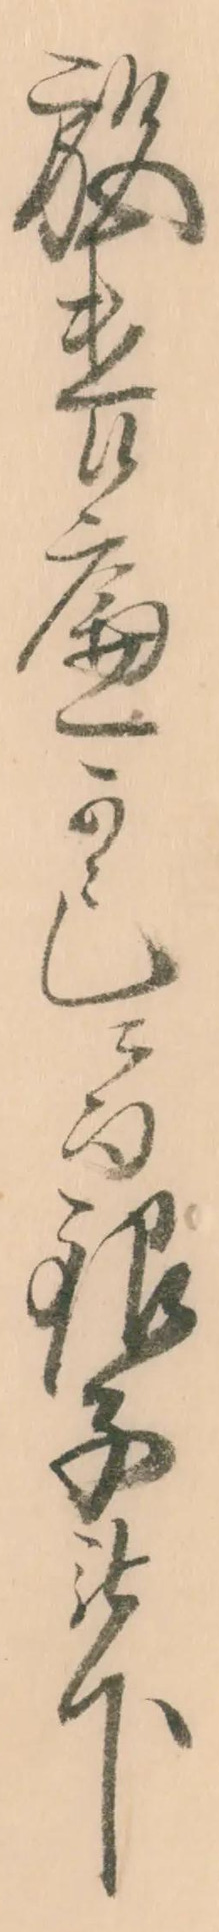施遣候廉而已にて銀子被下
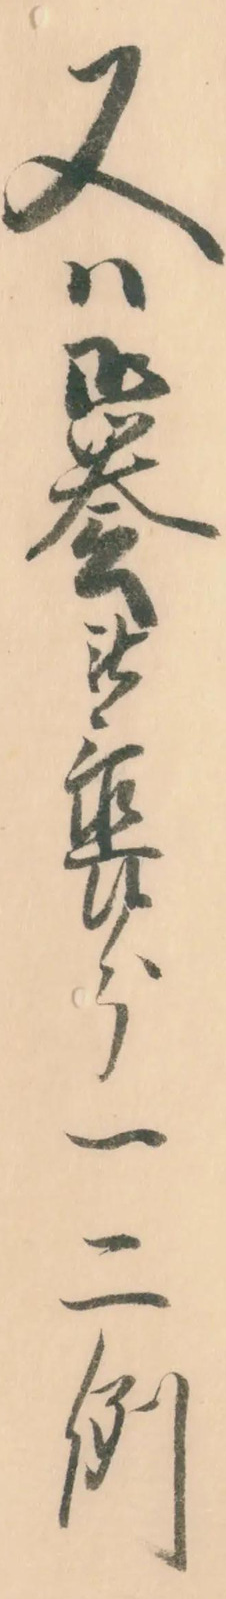又は御誉被置候分一二例
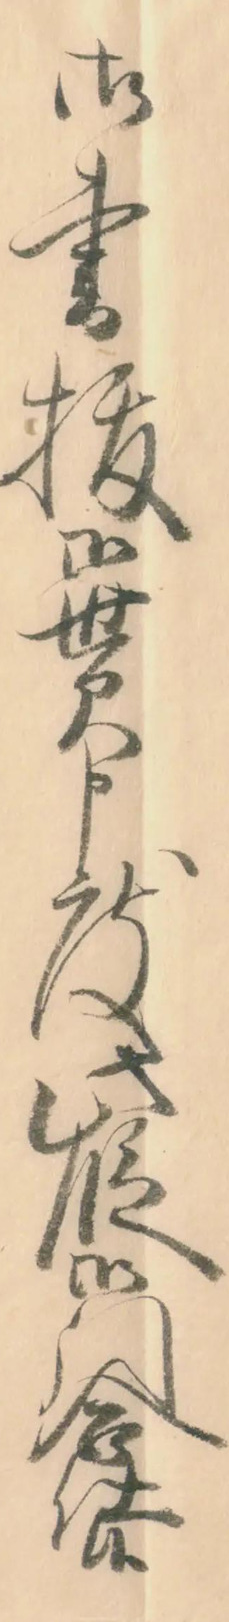御書抜御貰申度此段御引合仕候

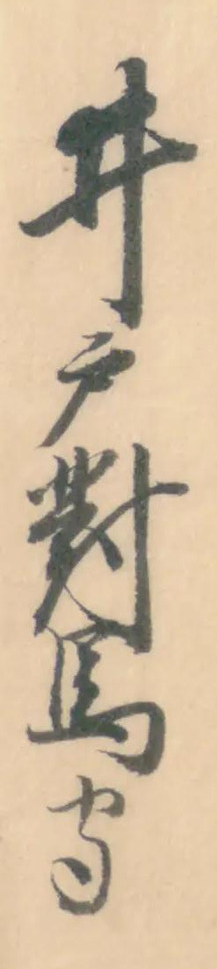井戸対馬守

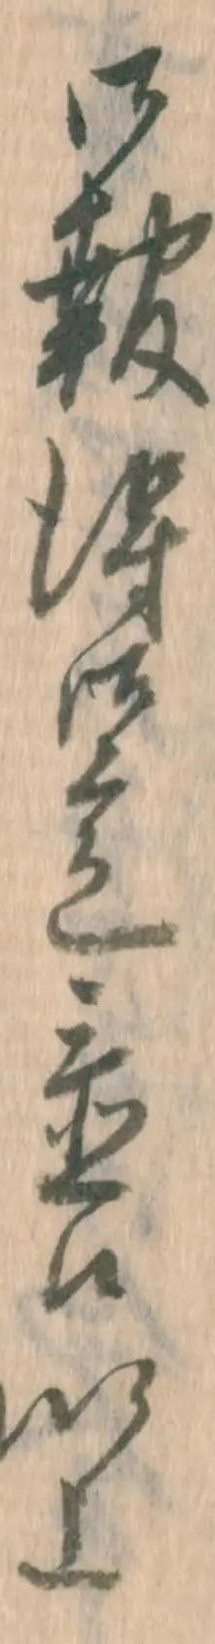御報得御意置候以上
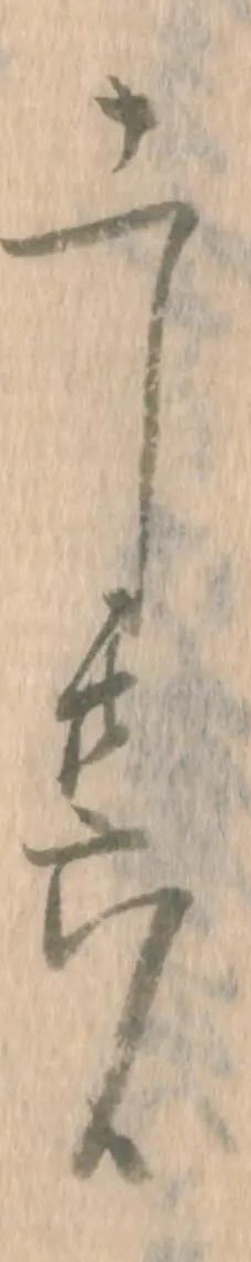十一月廿六日
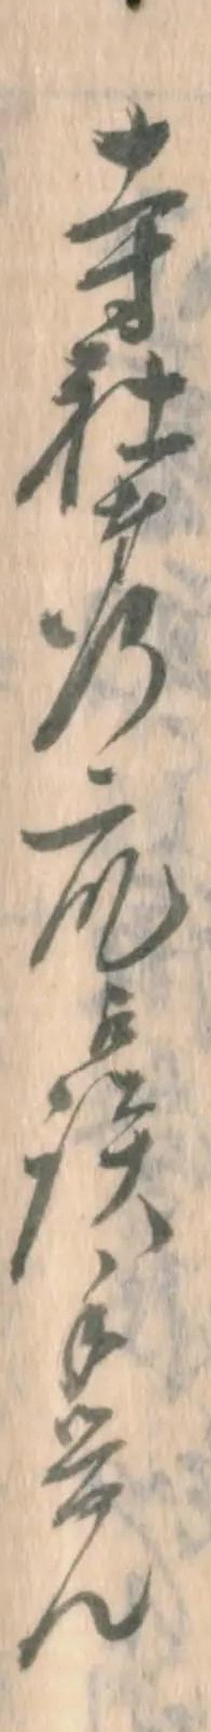寺社奉行衆え談手覚
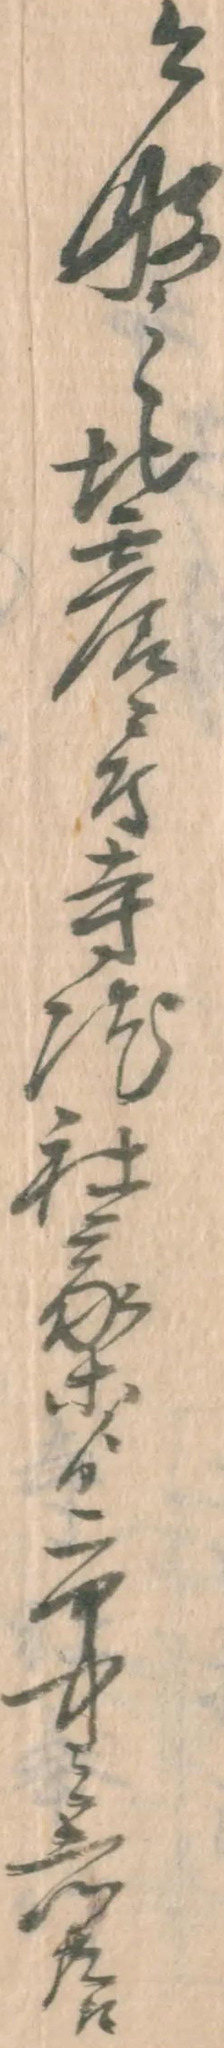今般之地震ニ付寺院社家等ゟ市中之者共え

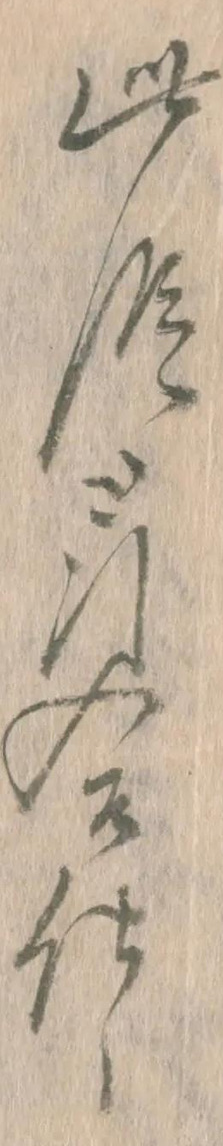此段御引合仕候
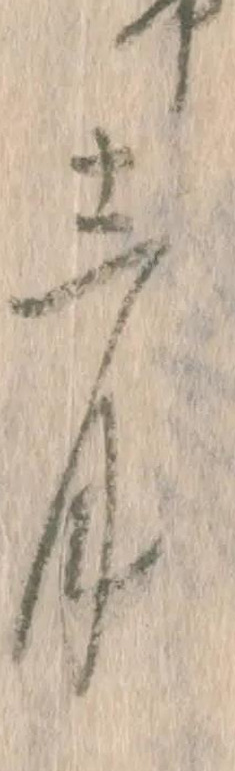卯十二月
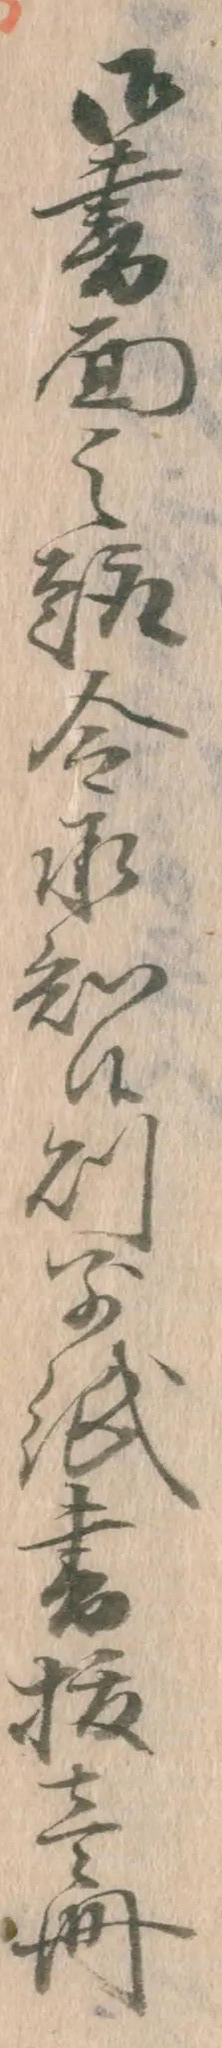御書面之趣令承知候則別紙書抜壱冊
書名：武家方并寺院等ニテ施差出候一件
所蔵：国立国会図書館 National Diet Library, JAPAN
